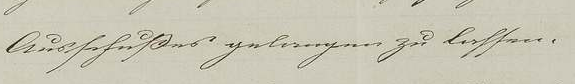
Ausschußes gelangen zu lassen.
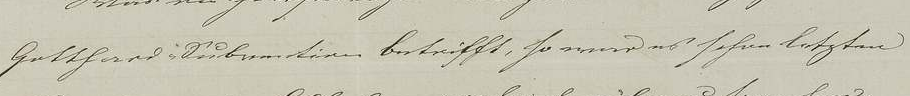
Gotthard-Subvention betrifft, so war es schon letzten
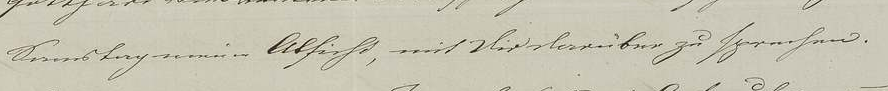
Samstag meine Absicht, mit Dir darüber zu sprechen.
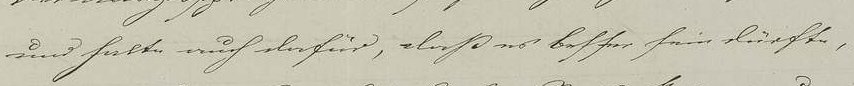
und halte auch dafür, daß es besser sein dürfte,
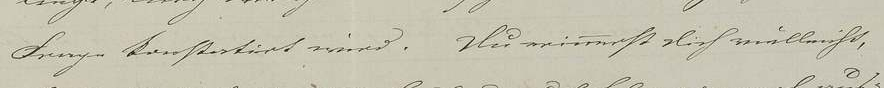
Frage konstatirt wird. Du erinnerst Dich vielleicht,
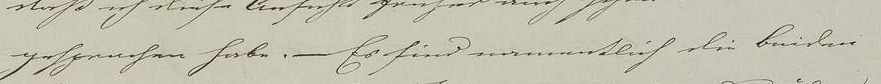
gesprochen habe. – Es sind namentlich die beiden
